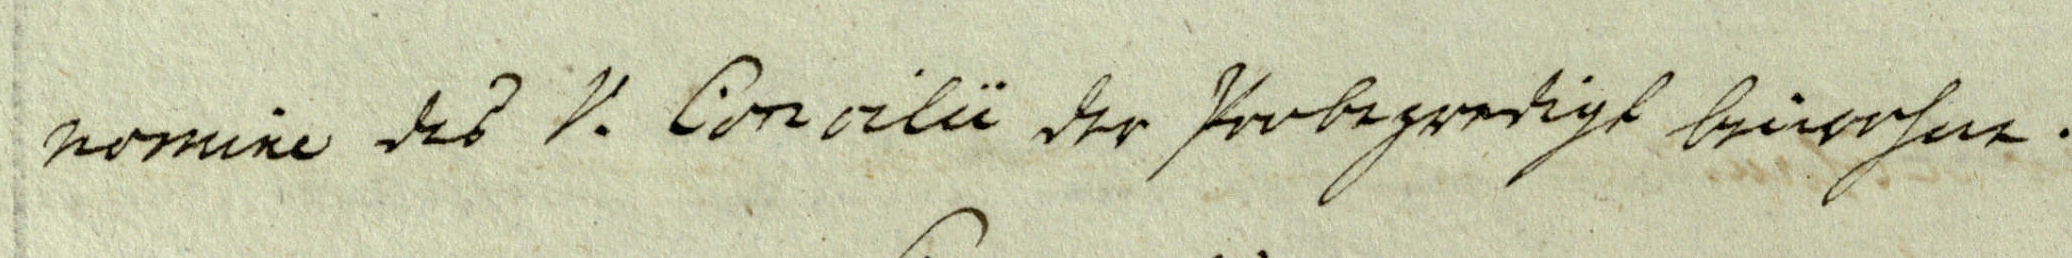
nomine des V. Concilii der Probepredigt beiwohne.
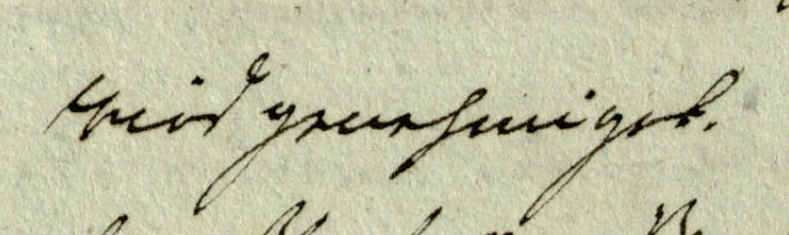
Wird genehmiget.
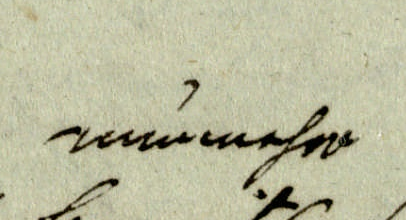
nunmehro
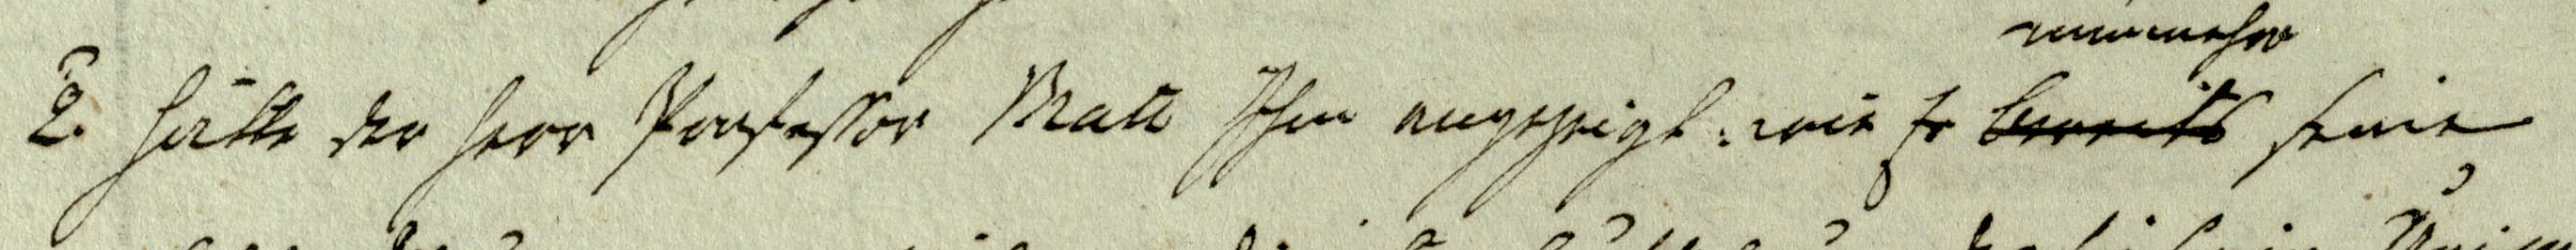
2. Hätte der Herr Professor Bratt Ihm angezeigt, wie Er bereits seine
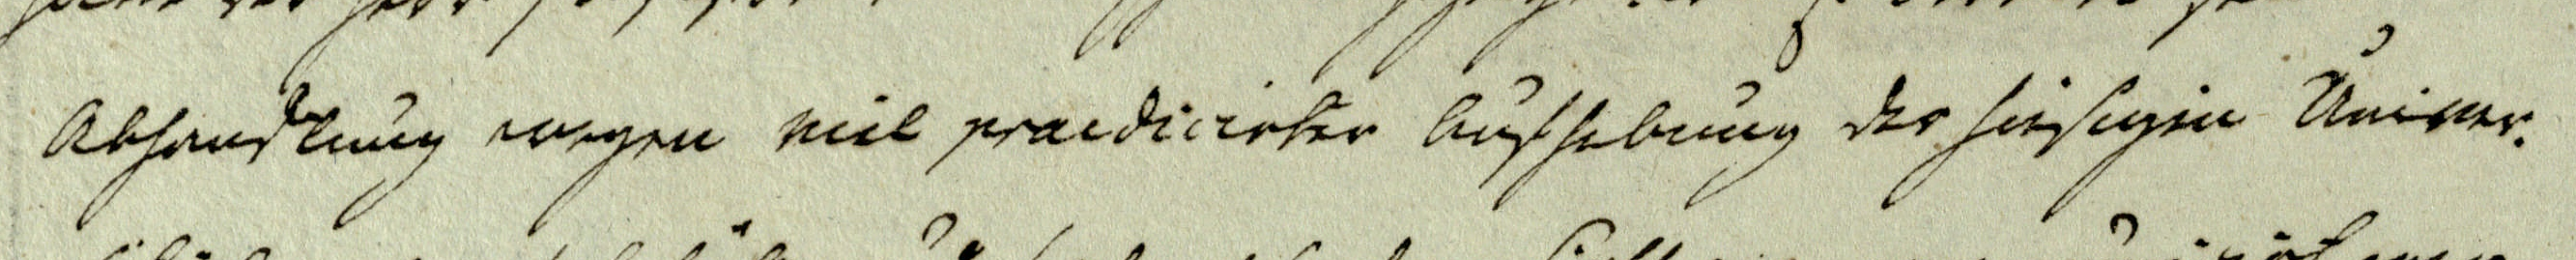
Abhandlung wegen viel praedicirter Aufhebung der hiesigen Univer¬
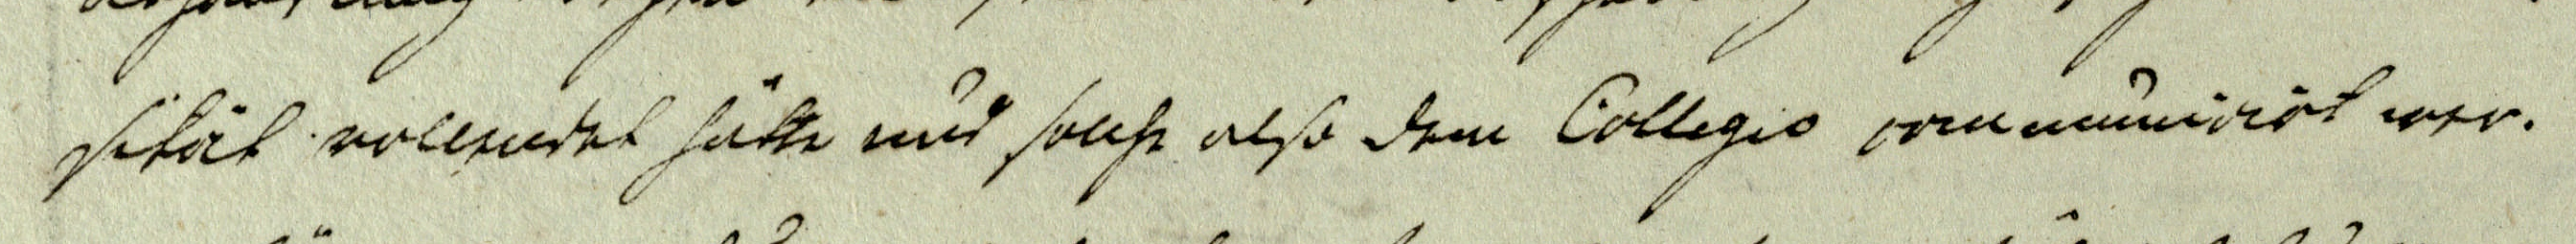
sität vollendet hätte und solche also dem Collegio communicirt wer¬
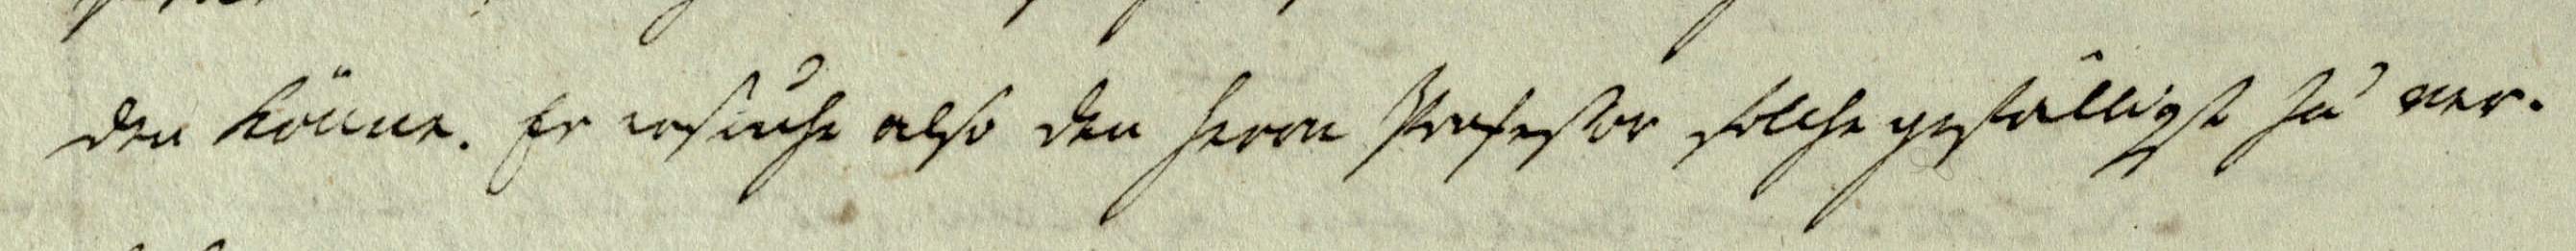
den könne. Er ersuche also den Herrn Professor solche gefälligst zu ver¬
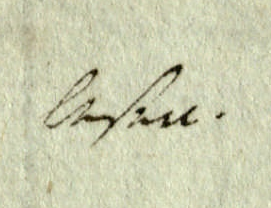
lesen.
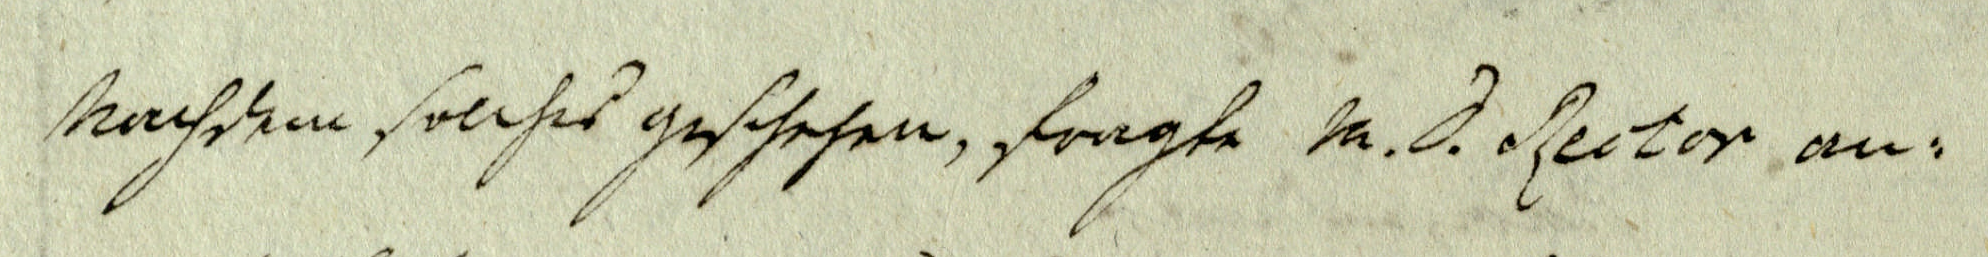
Nachdem solches geschehen, fragte M. D. Rector an:
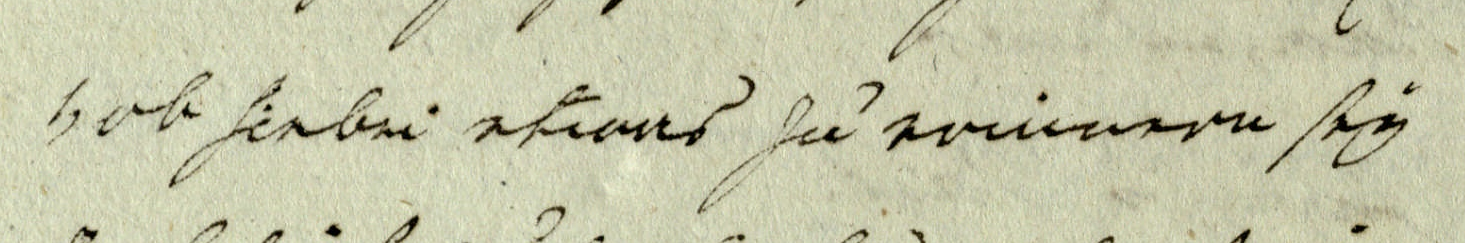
1, ob hiebei etwas zu erinnern seÿ
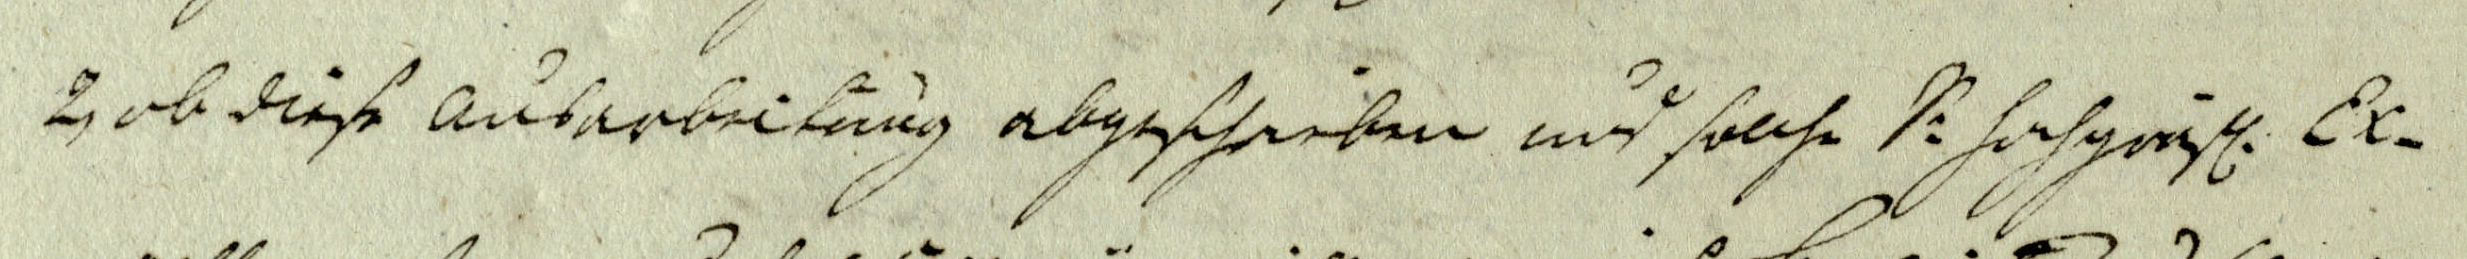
2., ob diese Ausarbeitung abgeschrieben und solche Sr Hochgräfl. Ex¬
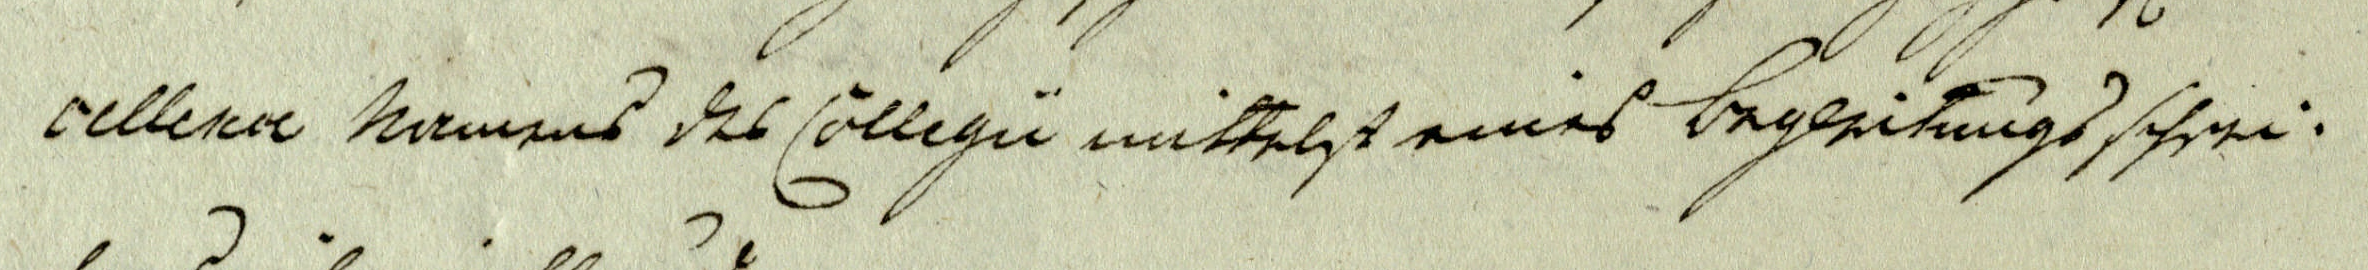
cellence Namens des Collegii mittelst eines Begleitungsschrei¬
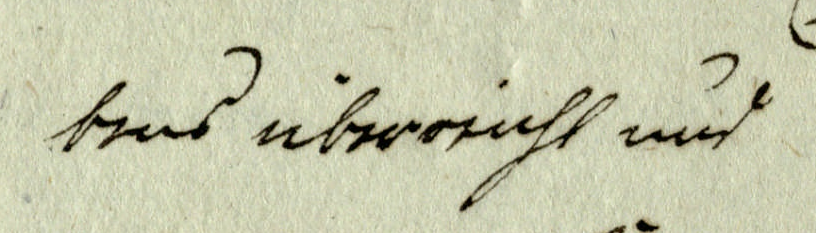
bens überreicht und
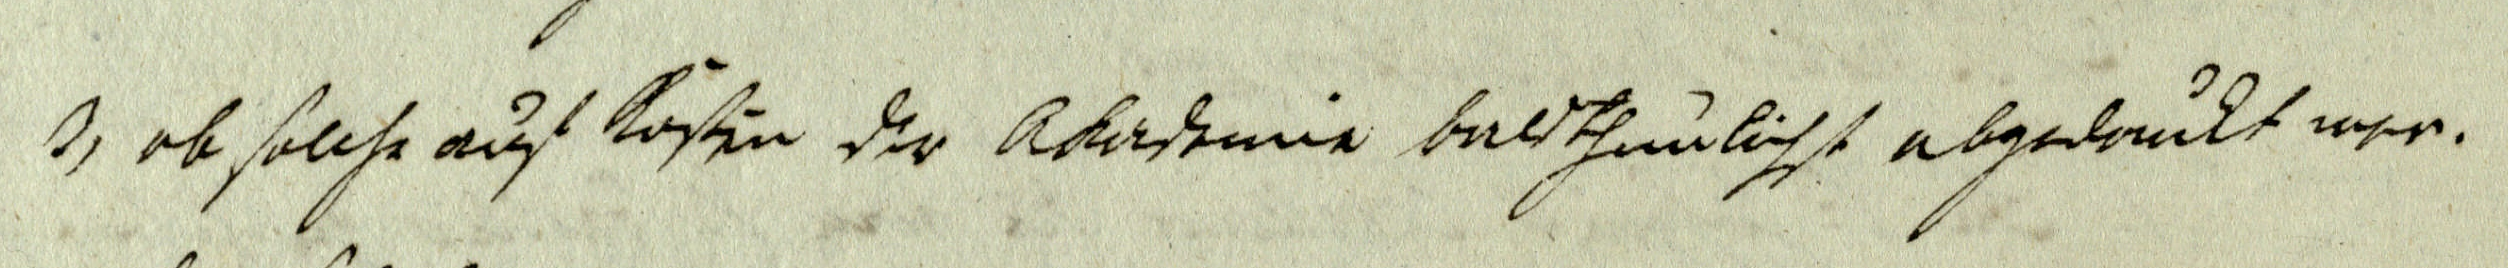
3, ob solche auf Kosten der Akademie baldthunlichst abgedruckt wer¬
